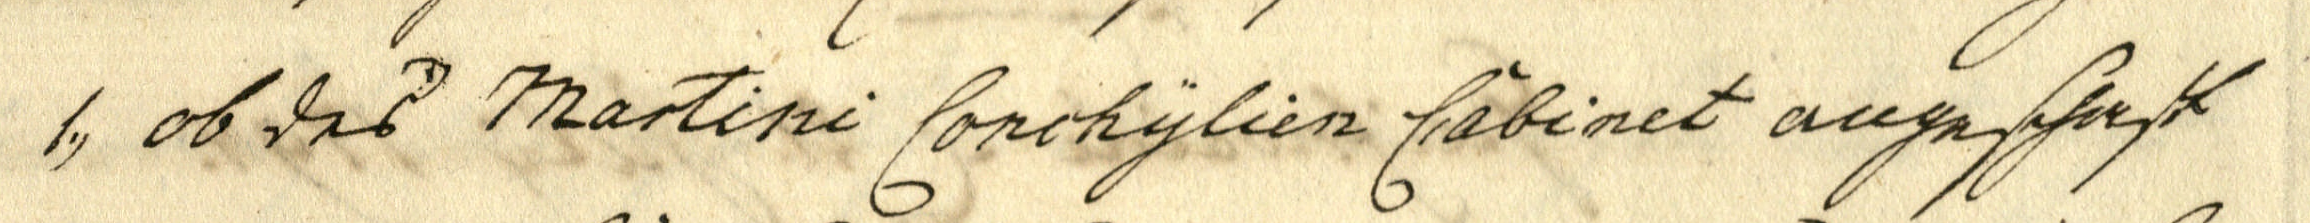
1., ob des Martini Conchylien Cabinet angeschaft
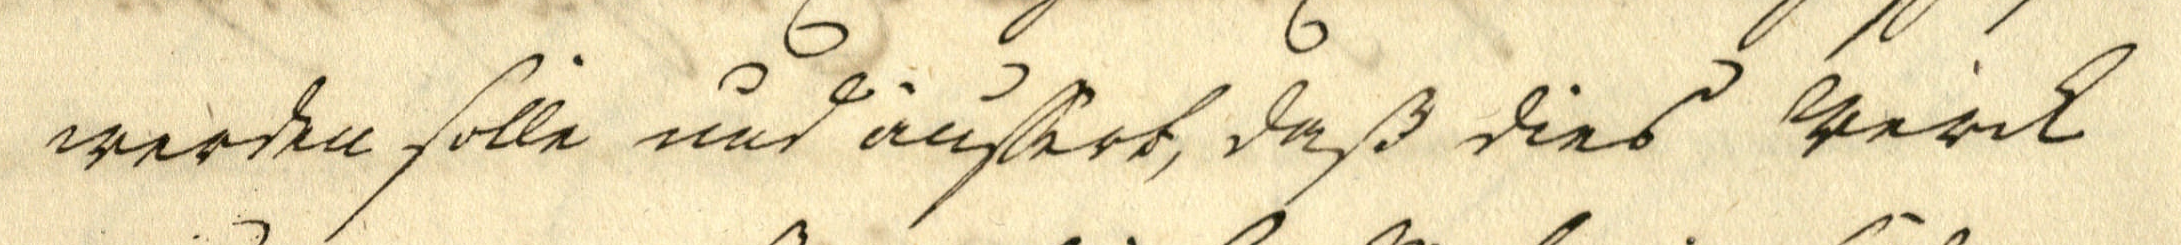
werden solle und äussert, daß dies Werck
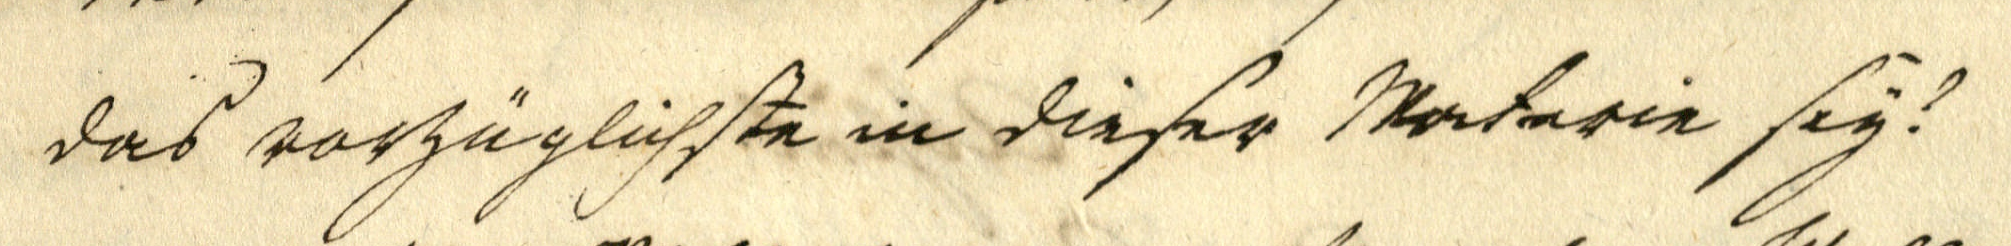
das vorzüglichste in dieser Materie sey?
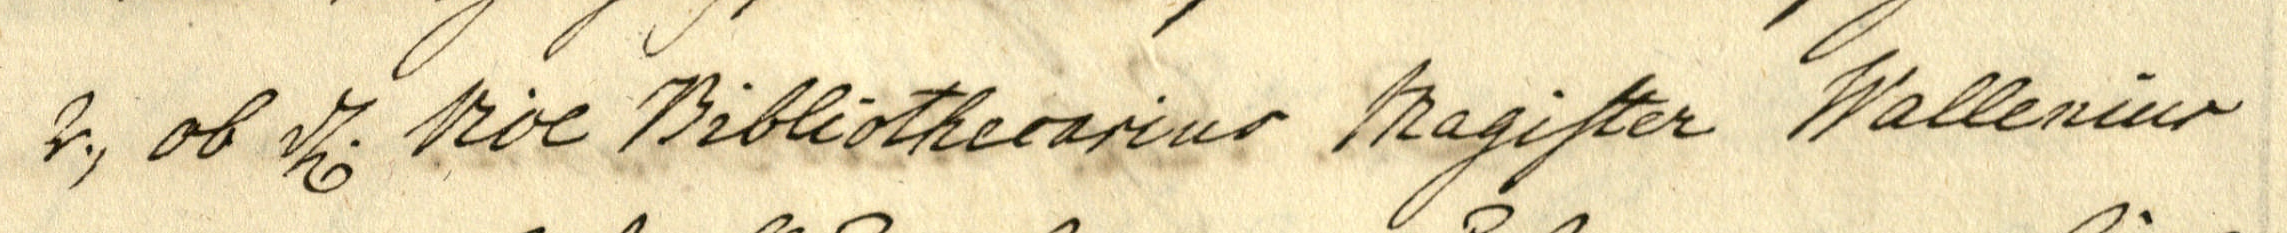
2., ob d.h. Vice Bibliothecarius Magister Wallenius
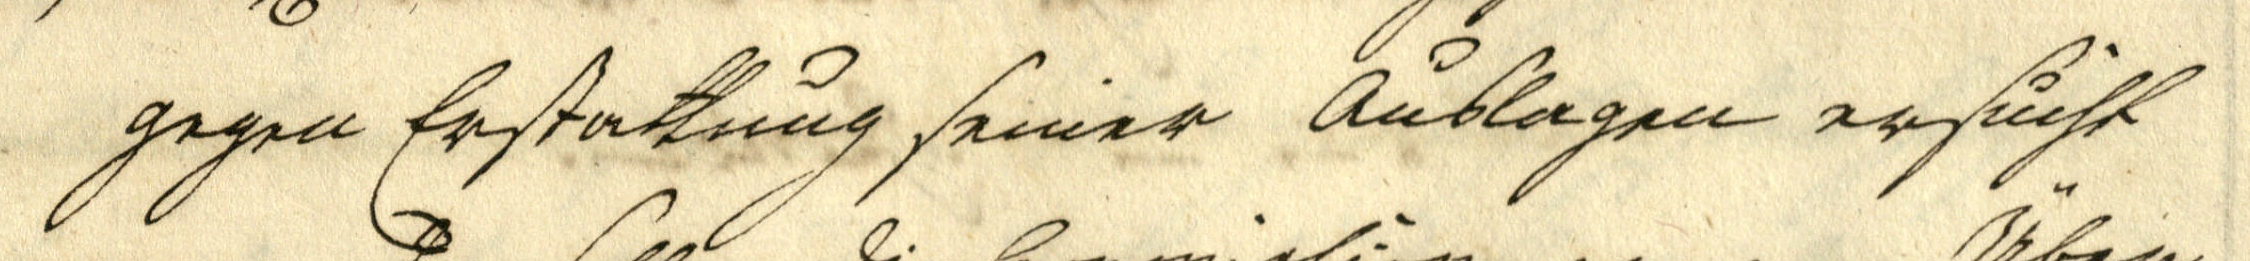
gegen Erstattung seiner Auslagen ersucht
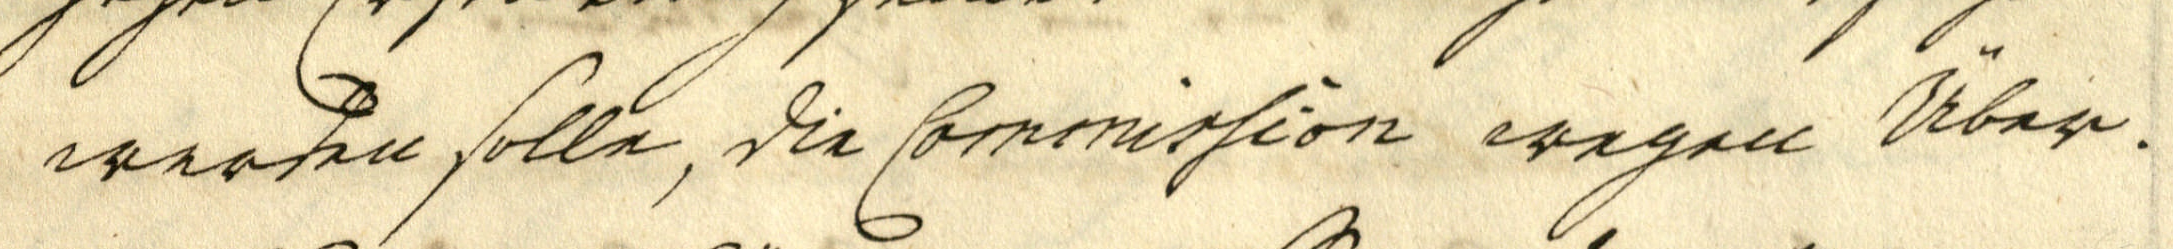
werden solle, die Commission wegen Über-
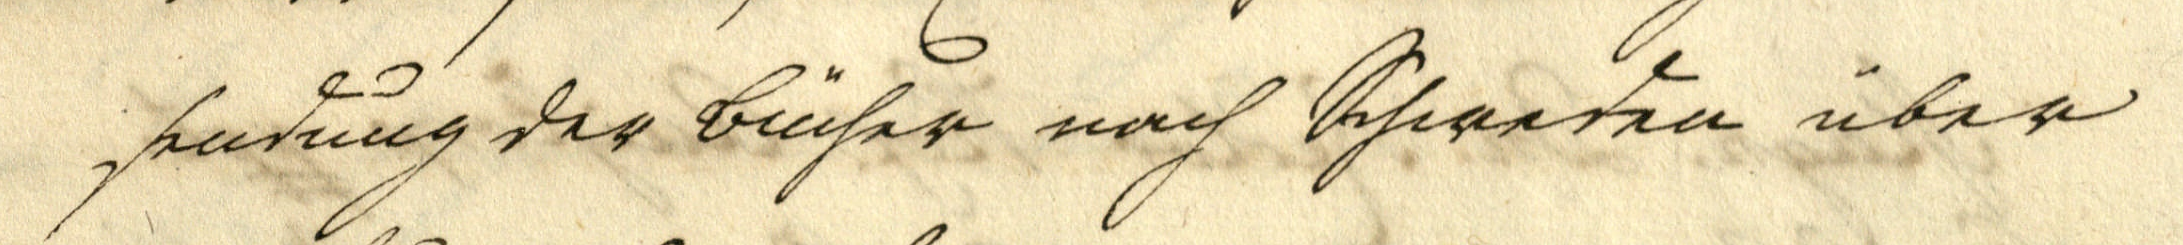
sendung der Bücher nach Schweden über
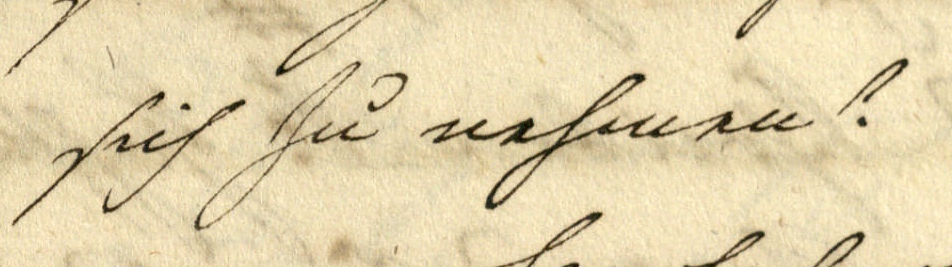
sich zu nehmen?
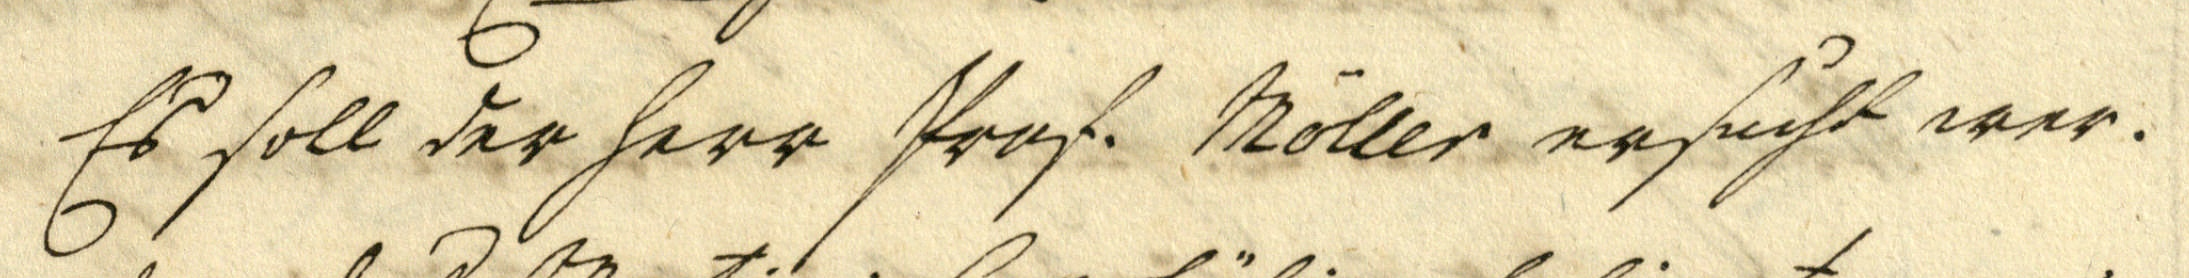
Es soll der Herr Prof. Möller ersucht wer-
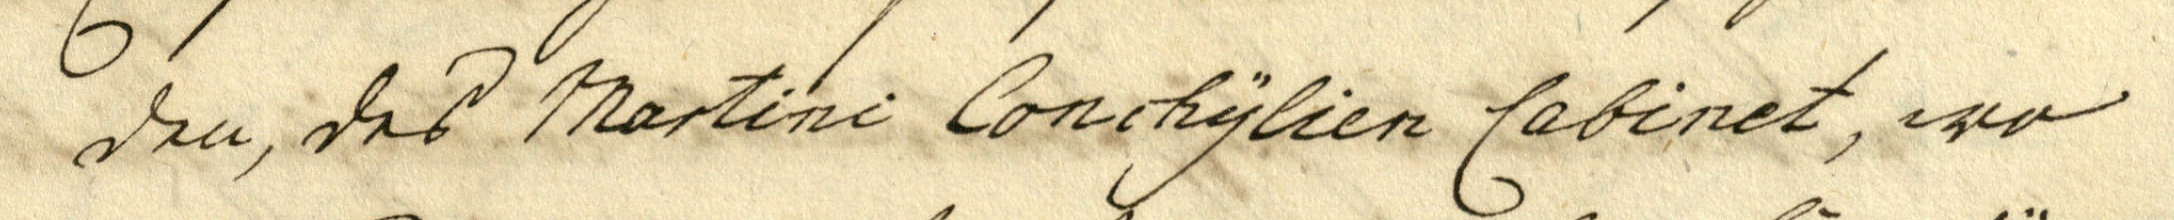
den, des Martini Conchylien Cabinet, wo
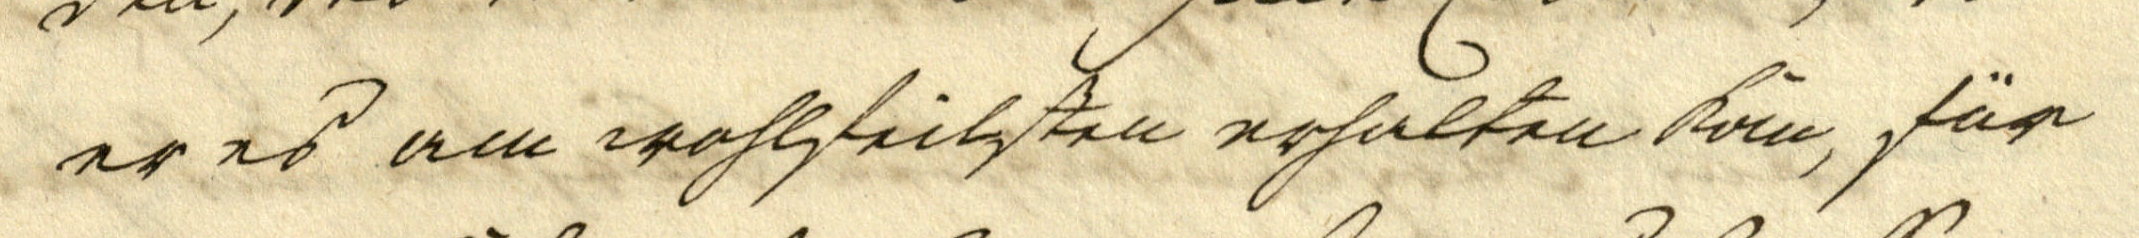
er es am wohlfeilsten erhalten kann, für
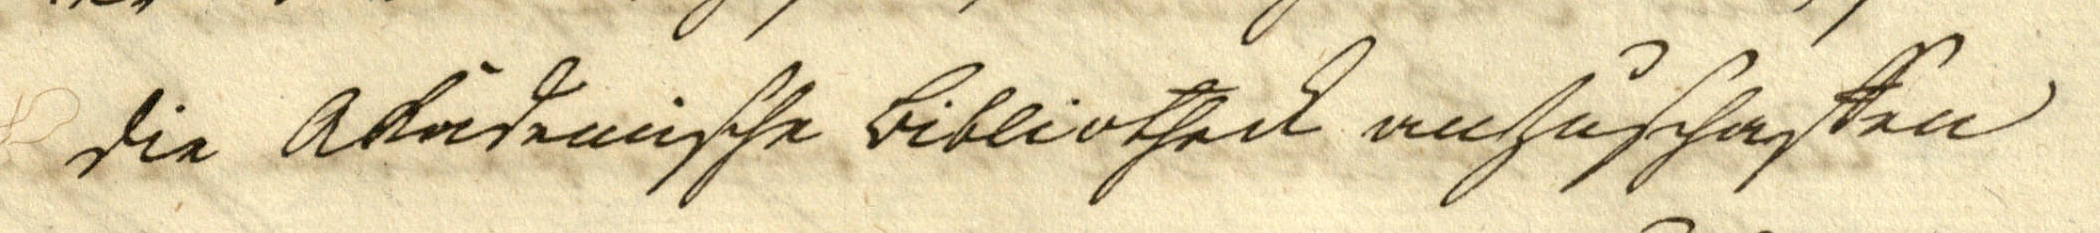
die Akademische Bibliothek anzuschaffen
